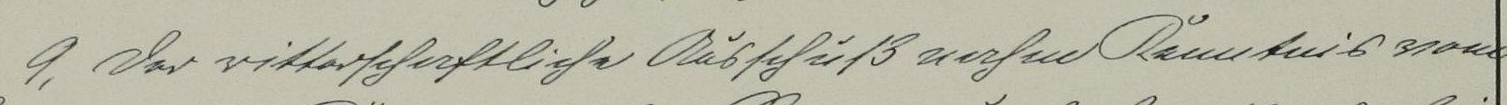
9. Der ritterschaftliche Ausschuß nahm Kenntnis vom
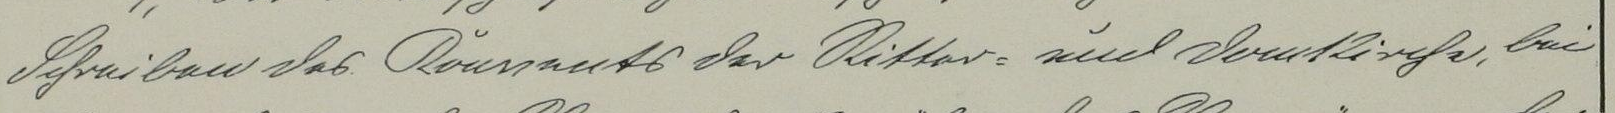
Schreiben des Konvents der Ritter- und Domkirche, bei
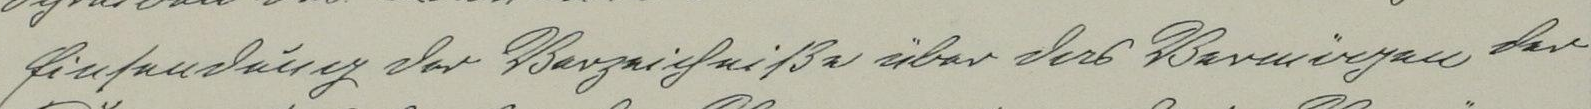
Einsendung der Verzeichniße über das Vermögen der
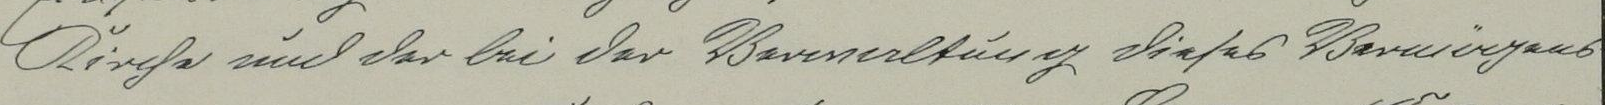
Kirche und der bei der Verwaltung dieses Vermögens
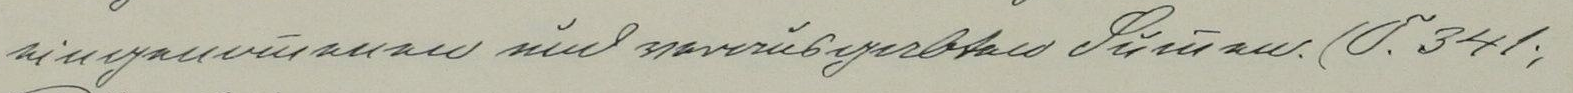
eingenommenen und verausgabten Summen. (T.341;
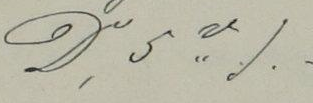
D.5v).
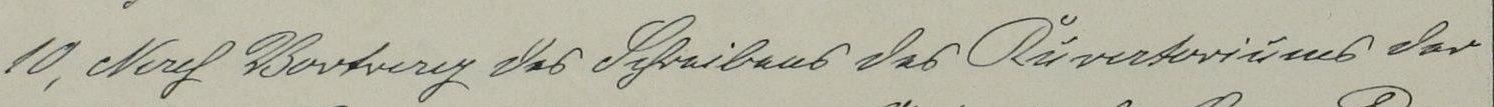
10. Nach Vortrag des Schreibens des Kuratoriums der
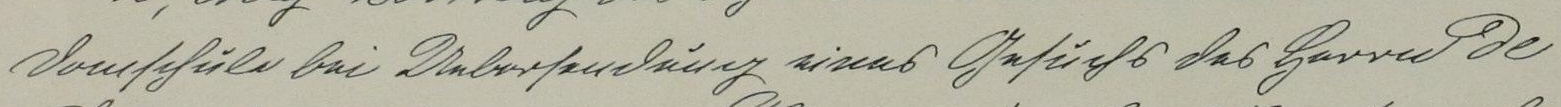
Domschule bei Uebersendung eines Gesuchs des Herrn de
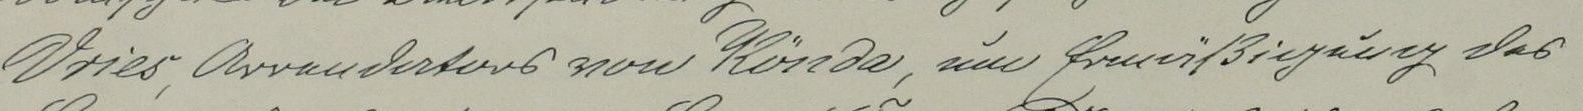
Vries, Arrendators von Könda, um Ermäßigung des
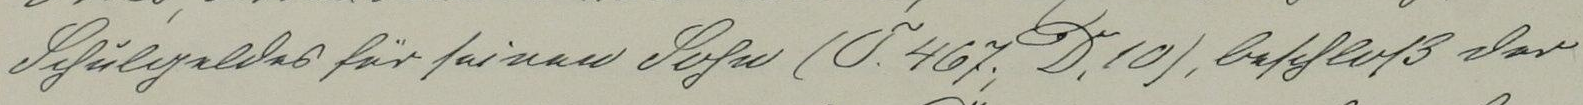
Schulgeldes für seinen Sohn (T.467; D.10), beschloß der
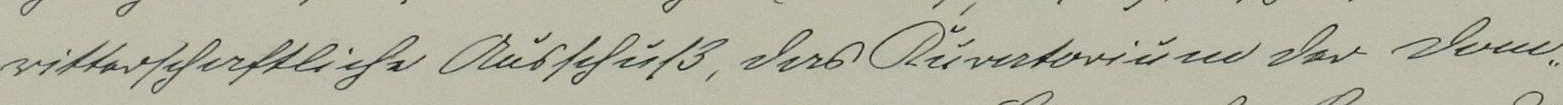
ritterschaftliche Ausschuß, das Kuratorium der Dom-
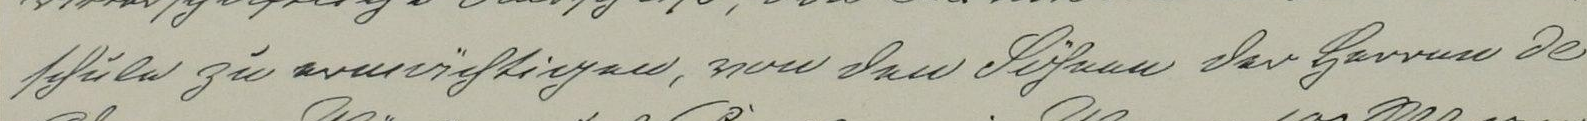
schule zu ermächtigen, von den Söhnen der Herren de
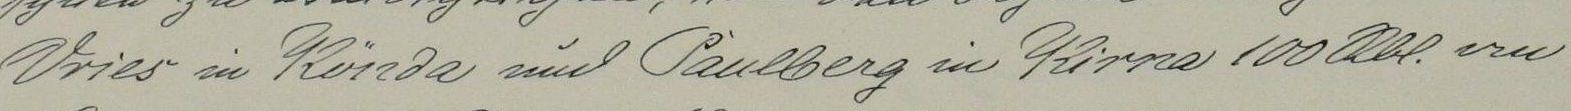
Vries in Könda und Paulberg in Kirna 100 Rbl. an
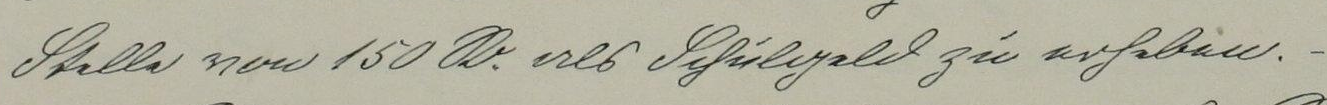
Stelle von 150 Ro. als Schulgeld zu erheben.
